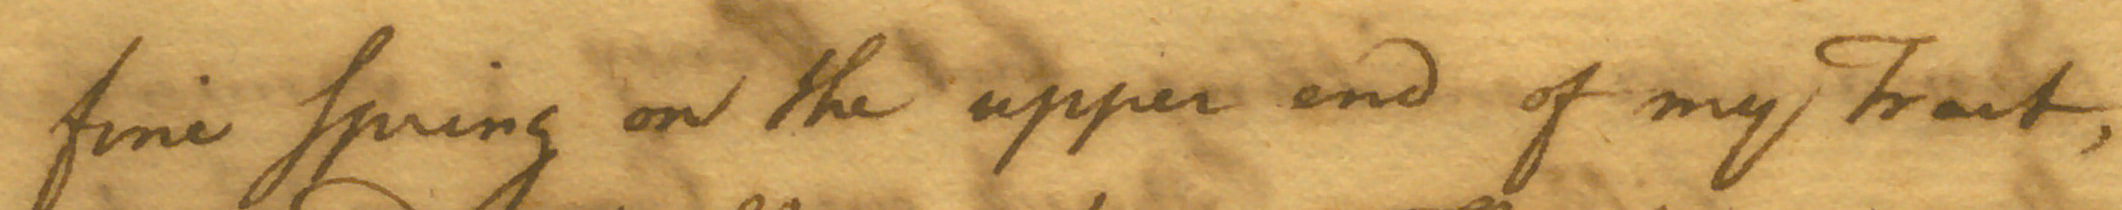fine spring on the upper end of my Tract,
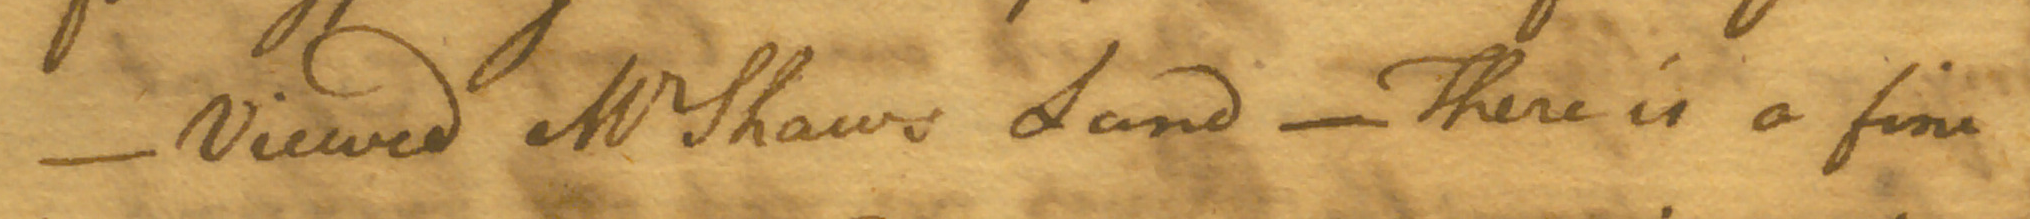- viewed M^r Shaws Land- There is a fine
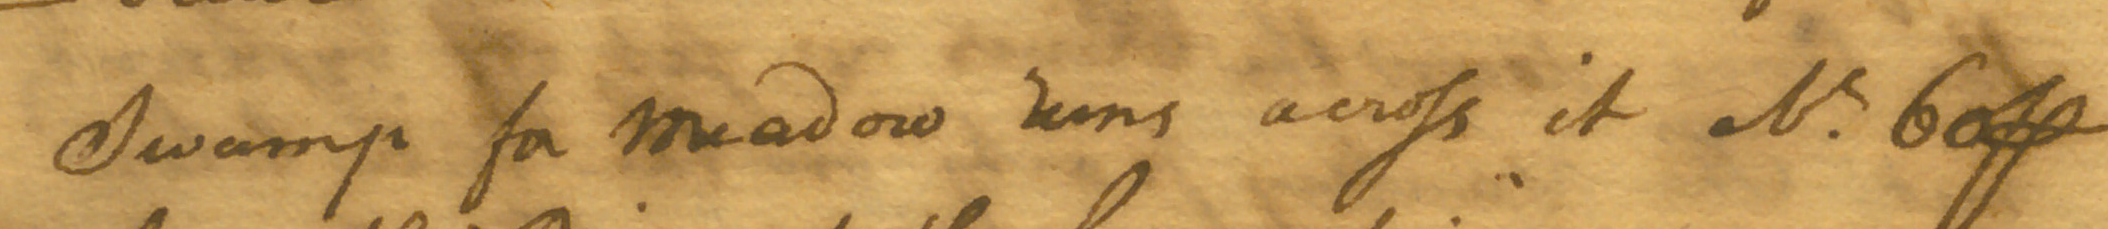Swamp for Meadow runs across it ab^t. 6 per
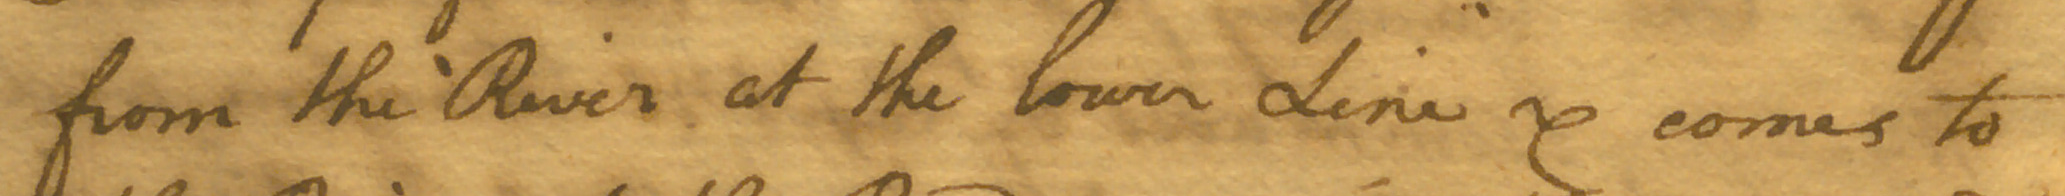from the River at the lower Line & comes to
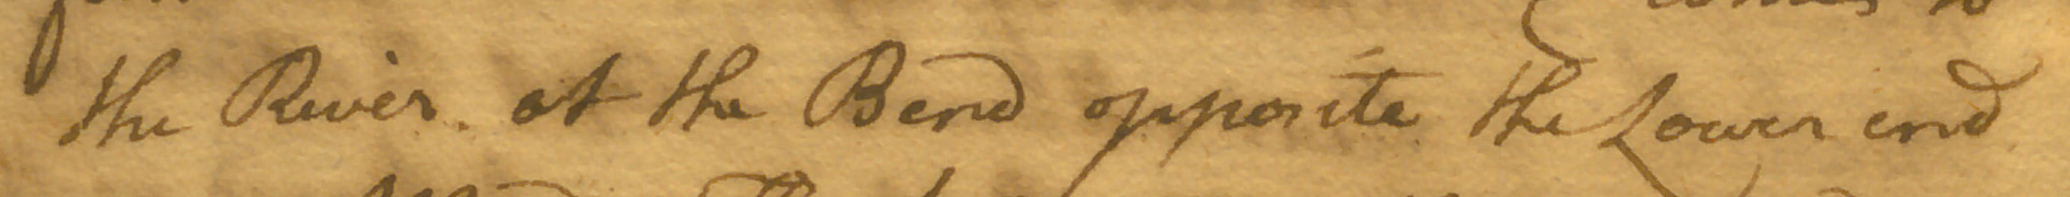the River at the Bend opposite the Lower end
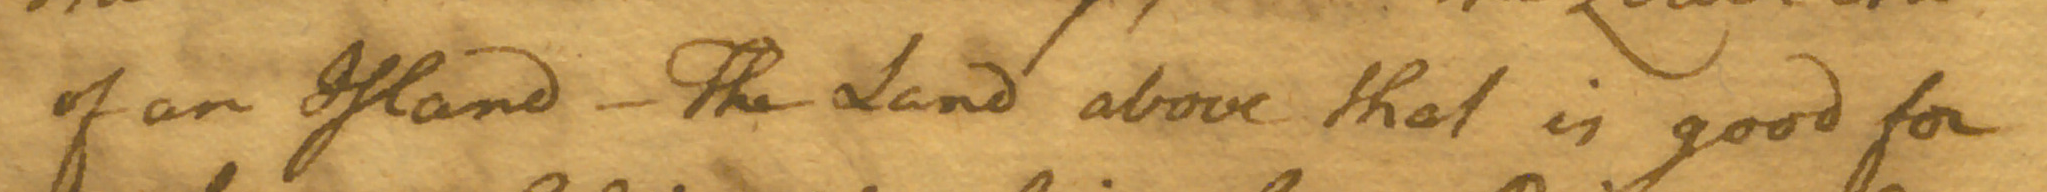of an Island- The Land above that is good for
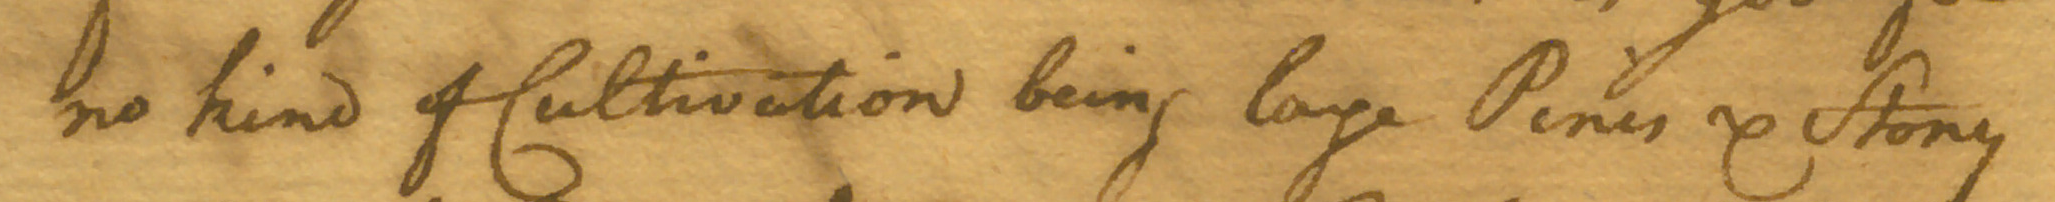no kind of Cultivation being large Pines & Stony
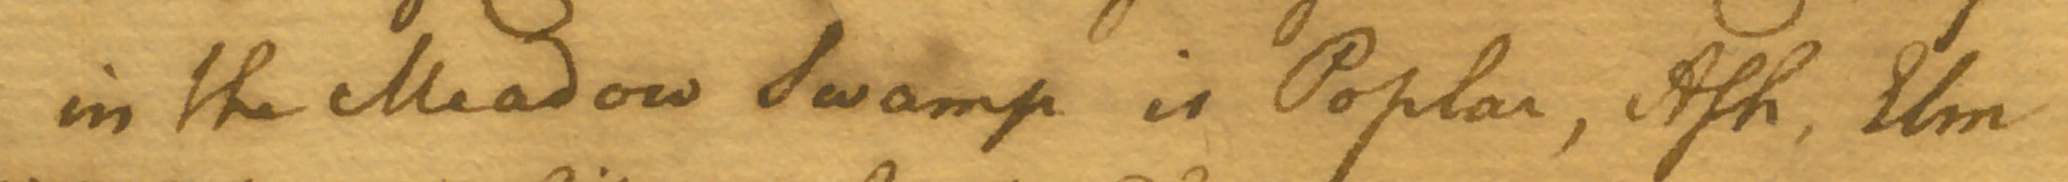in the Meadow Swamp is Poplar, Ash, Elm
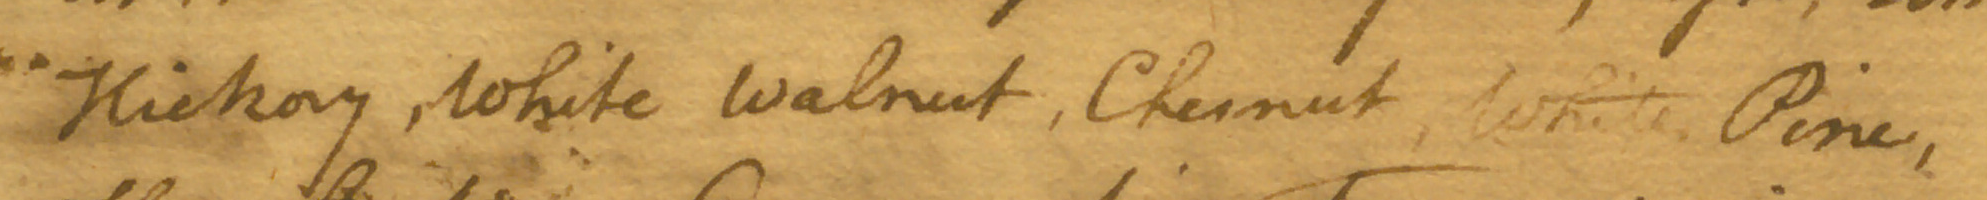Hickory, white walnut, Chestnut, white pine,
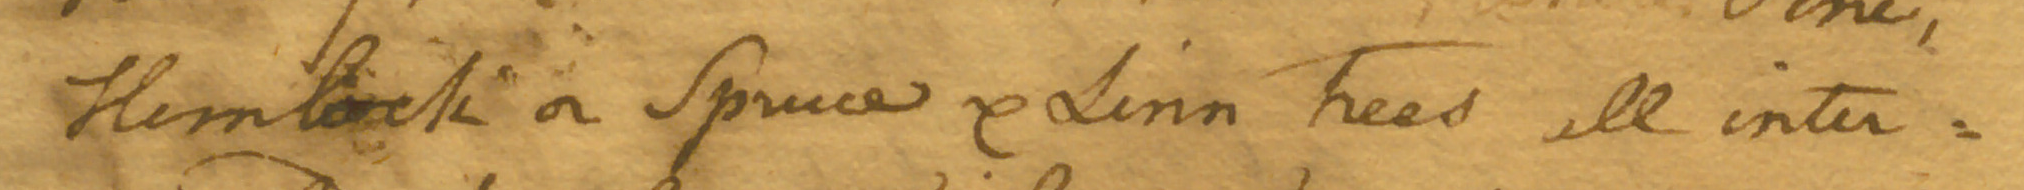Hemlock or Spruce & Linn Trees all inter-
